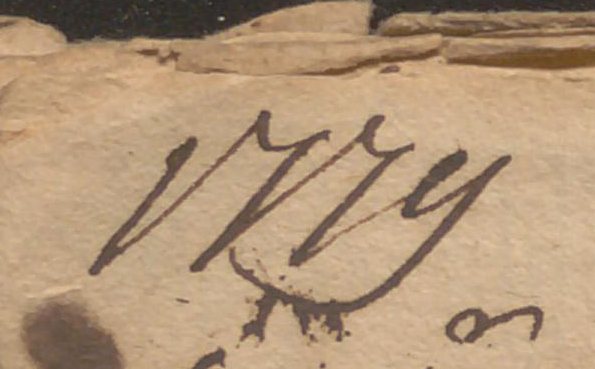1779
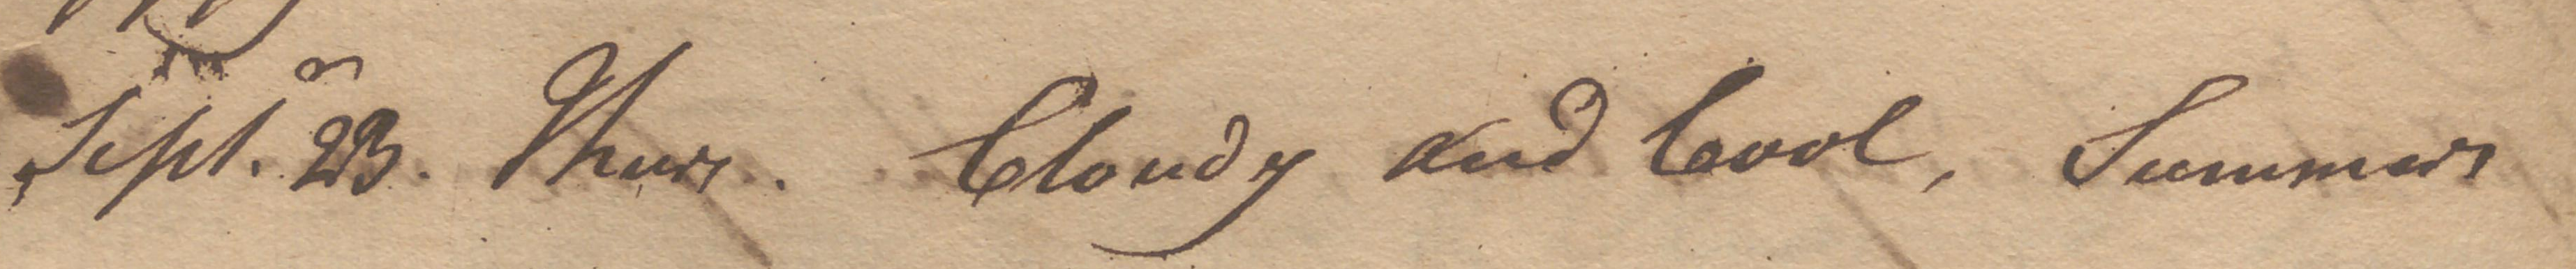Sept^r. 22. Thurs. Cloudy and Cool, Summers
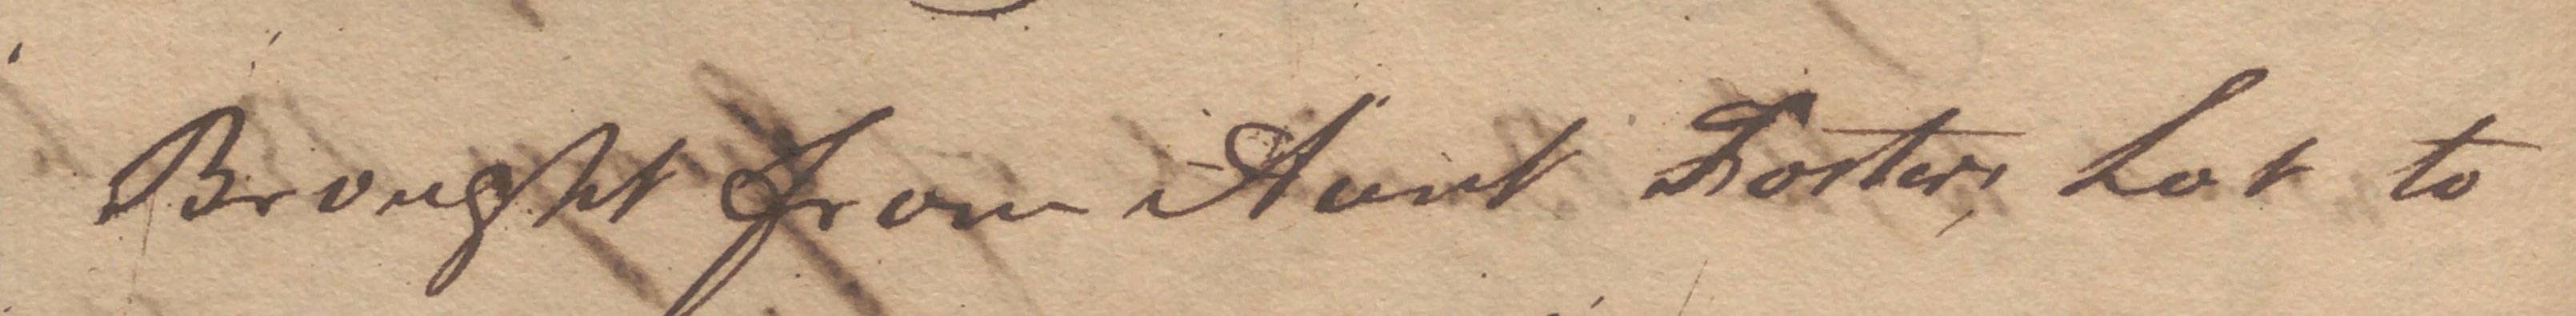Brought from Aunt Fosters Lot to
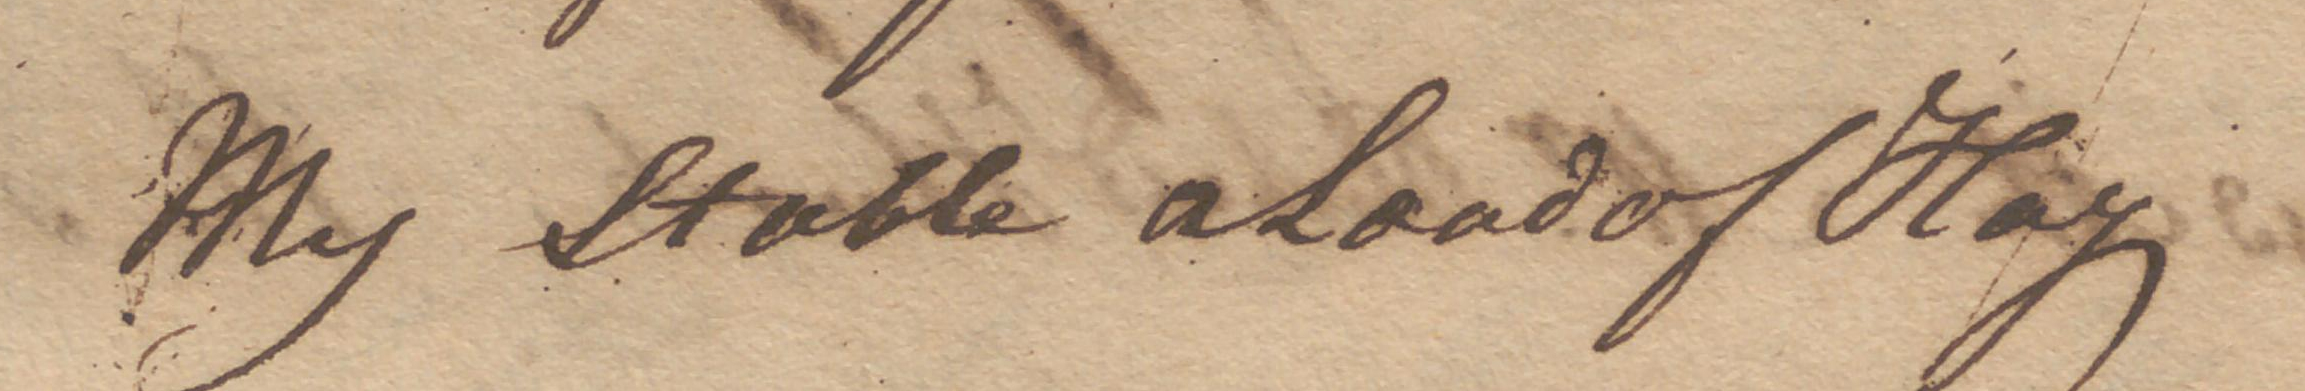My Stable a Load of Hay
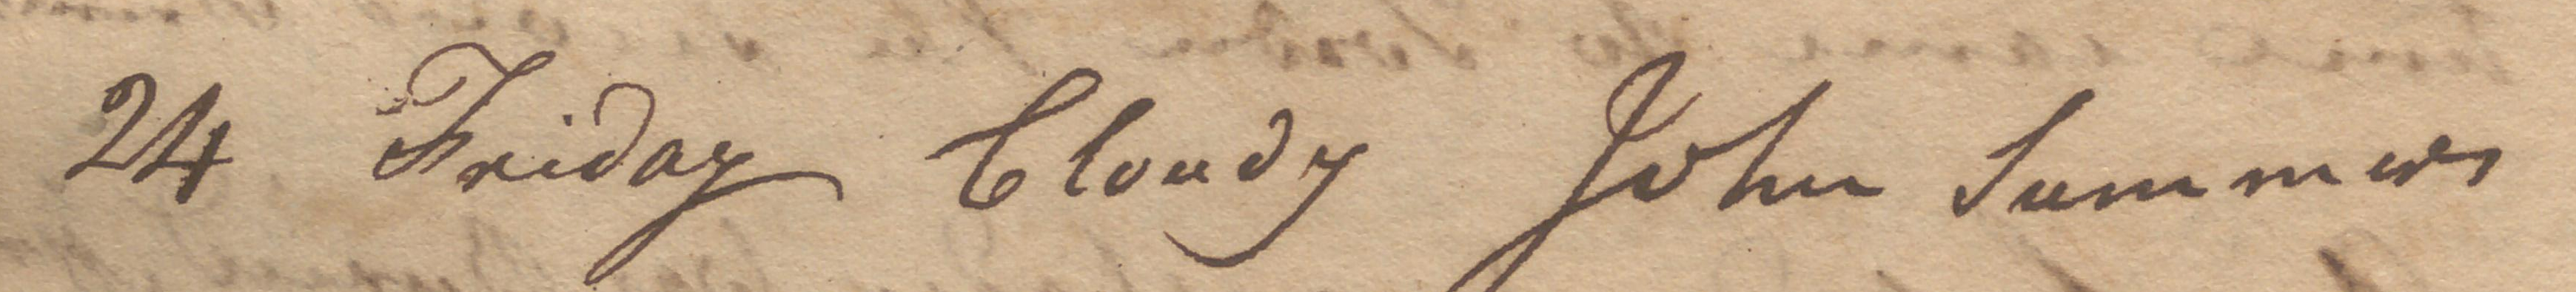24 Friday Cloudy John Summers
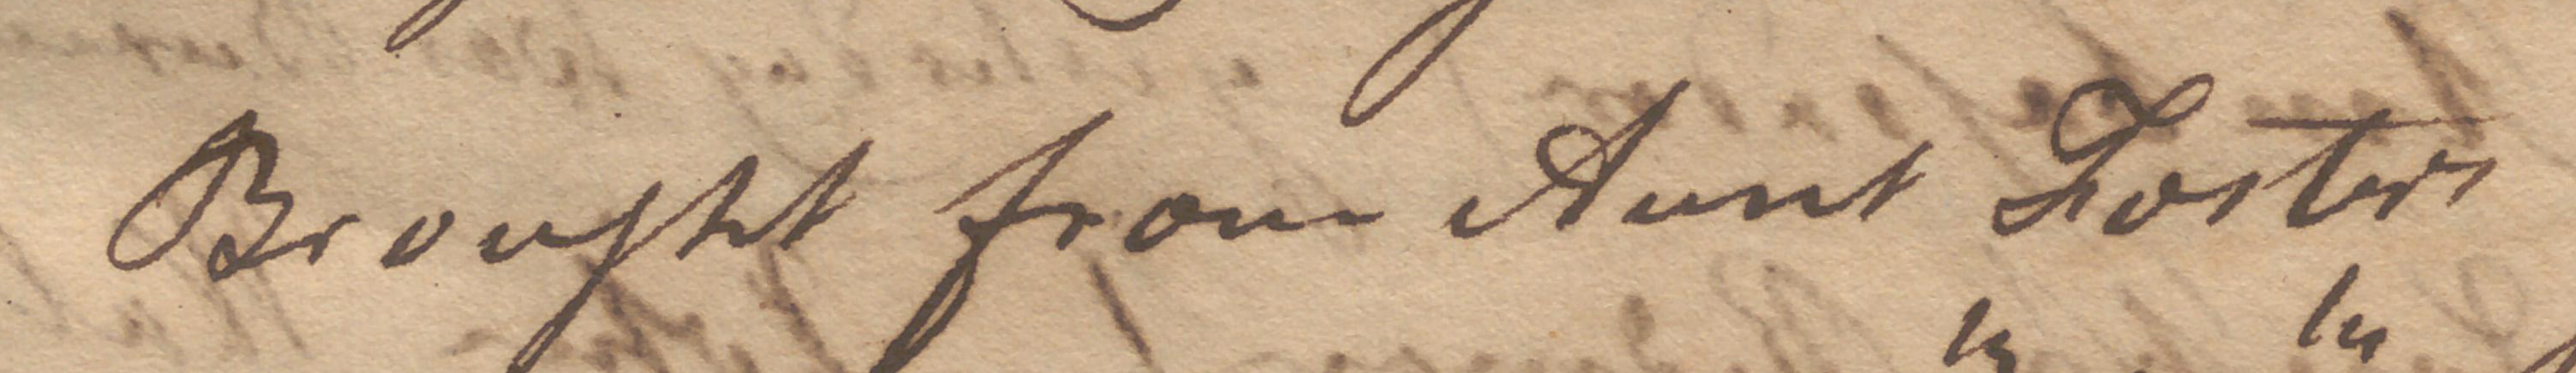Brought from Aunt Fosters
